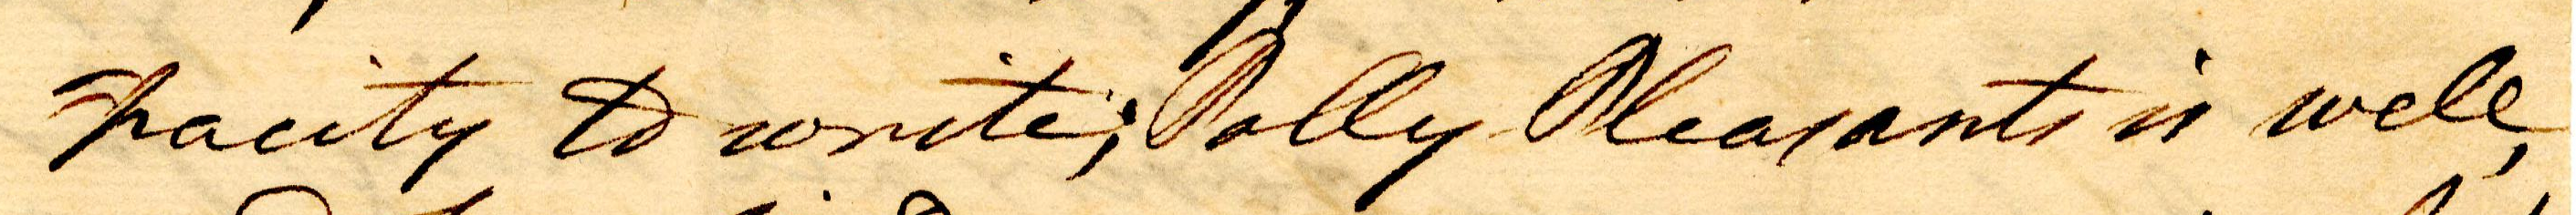-pacity to write; Polly Pleasants is well,
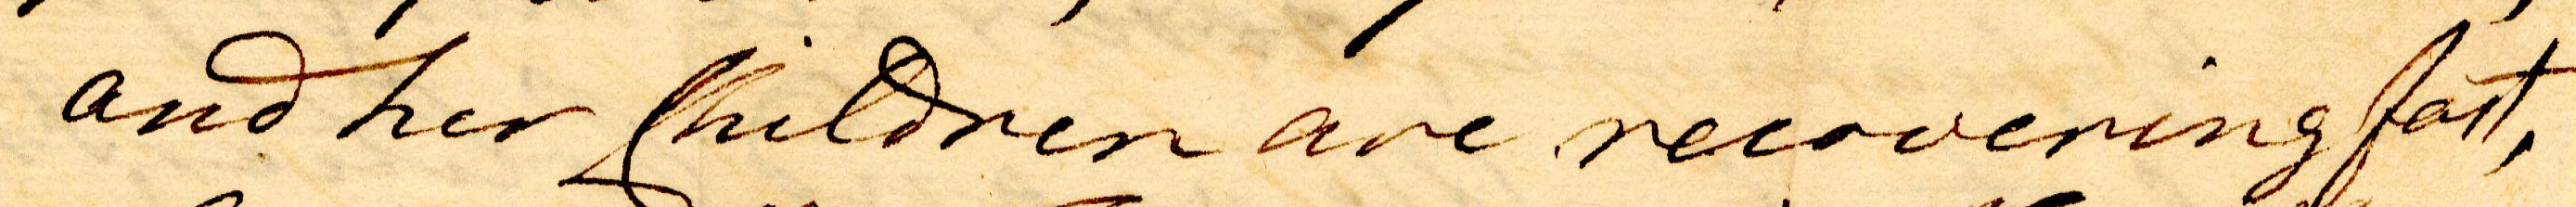and her Children are recovering fast,
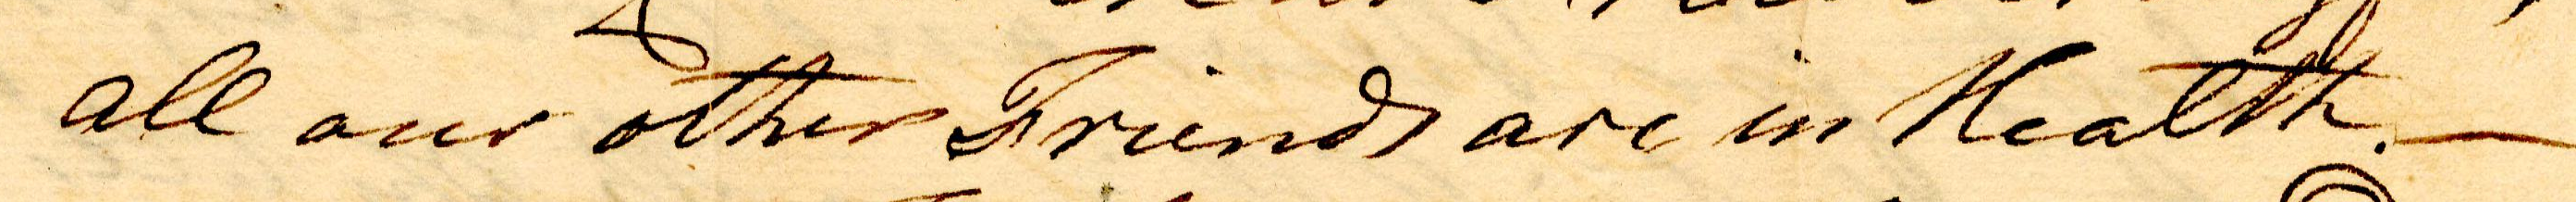all our other Friends are in Health.-
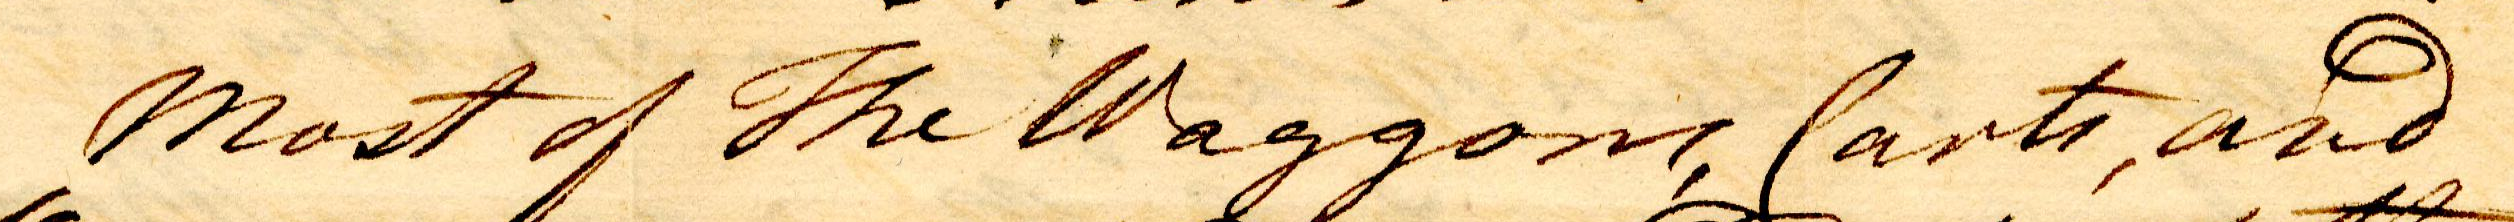Most of The Waggons, Carts and
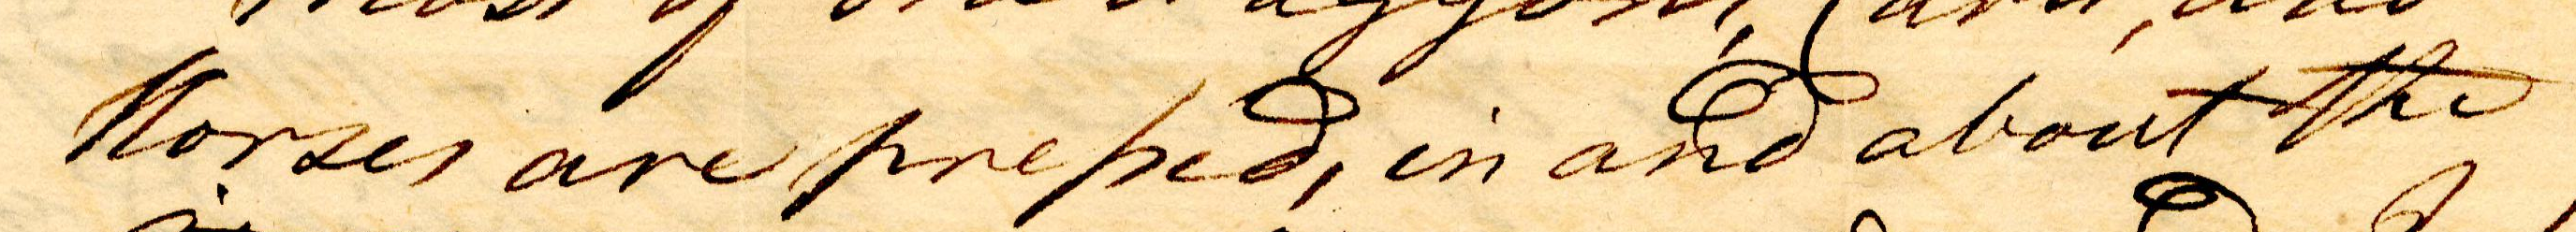Horses are pressed, in and about the
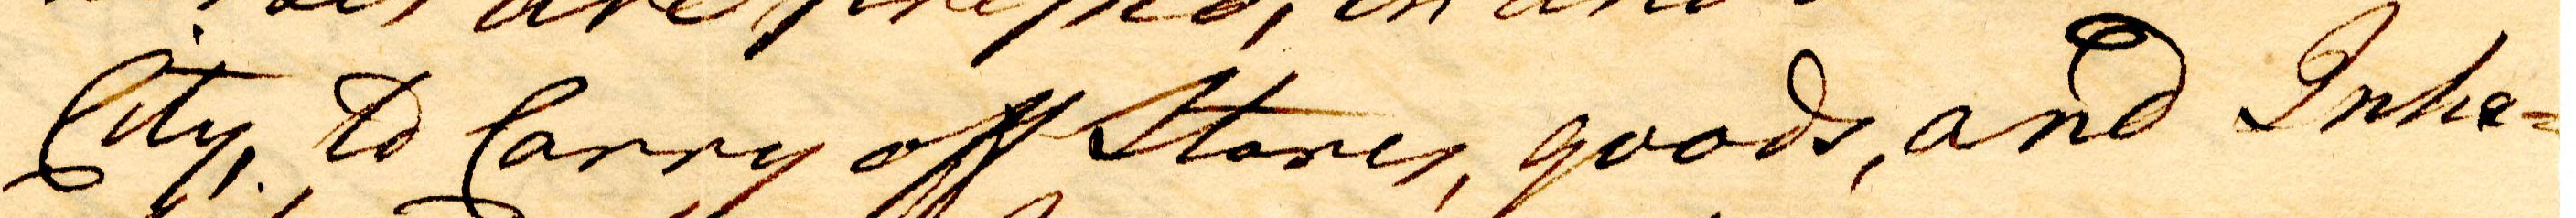City, to Carry off Stores, goods, and Inha-
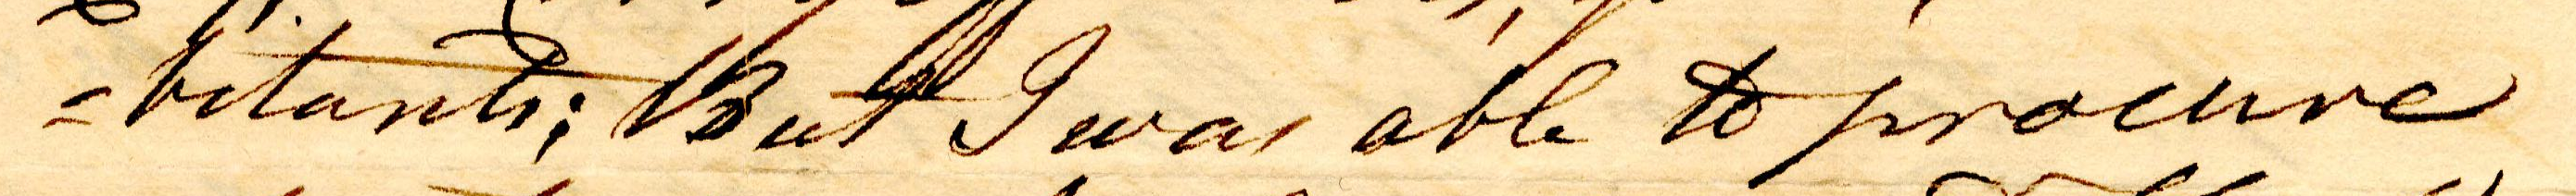-bitants; But I was able to procure
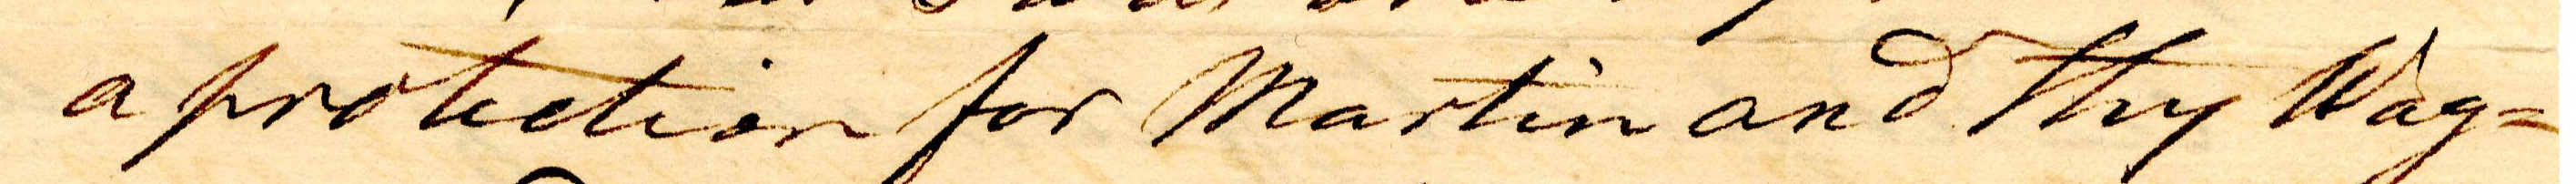a protection for Martin and thy Wag-
